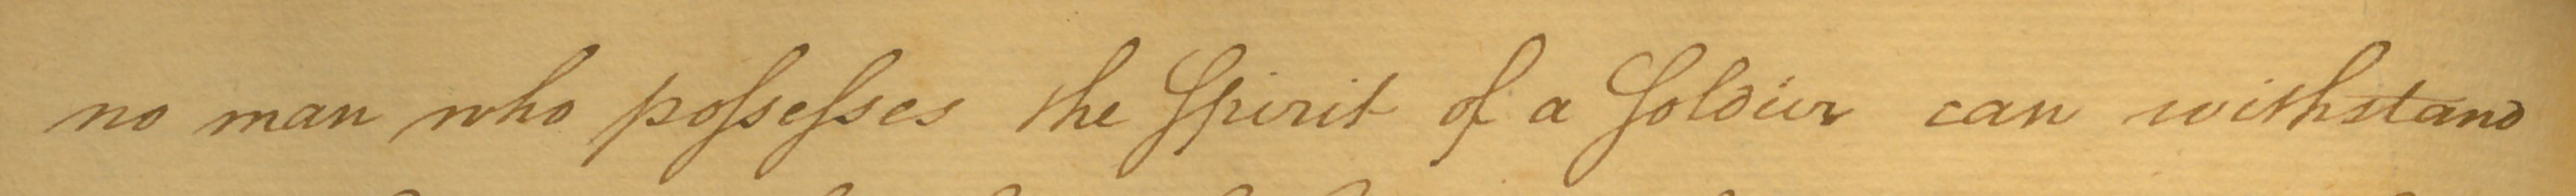no man who possesses the Spirit of a Soldier can withstand
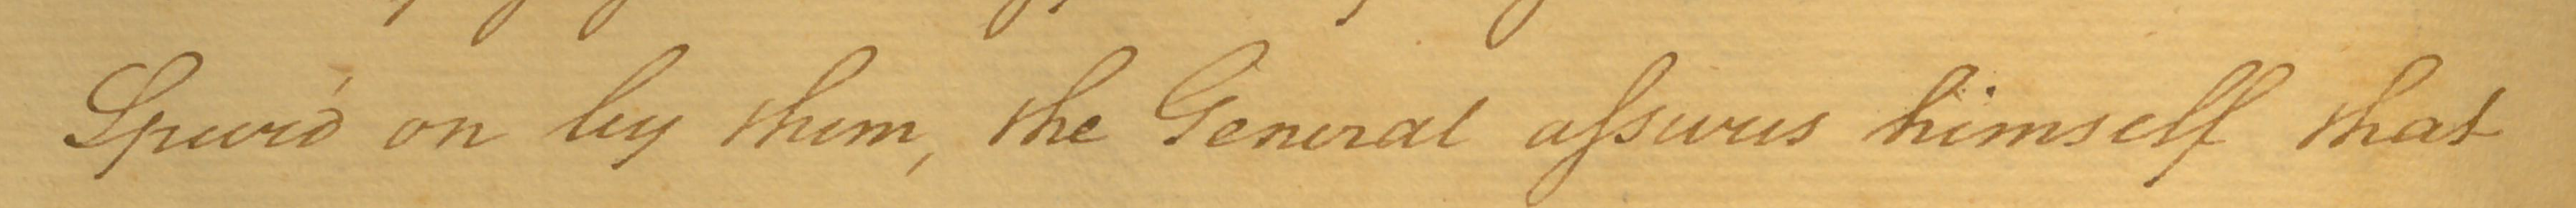Spur'd on by them, the General assures himself that
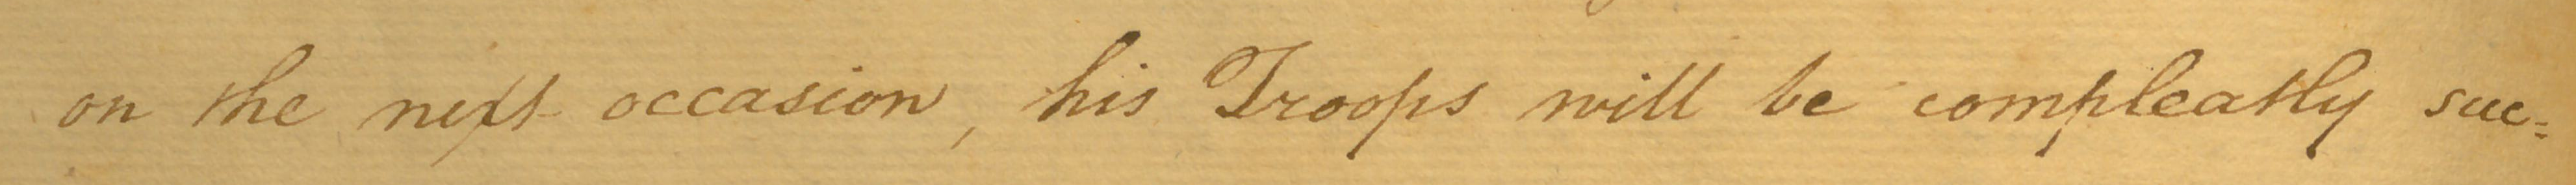on the next occasion, his Troops will be compleatly suc-
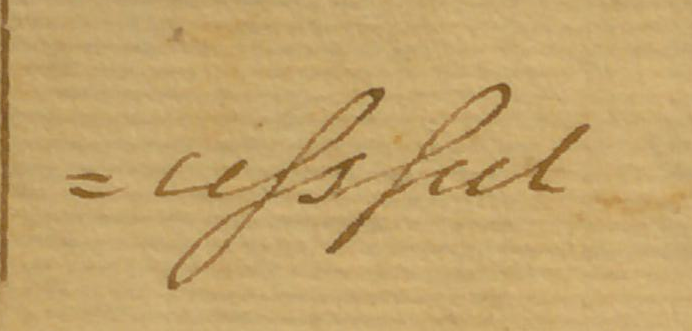-cessful
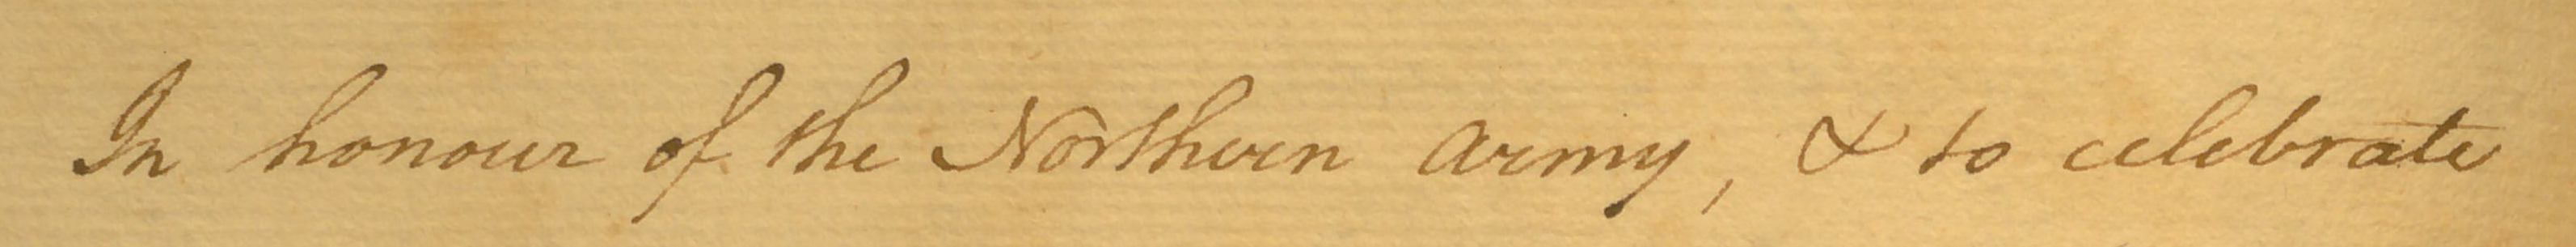In honour of the Northern army, & to celebrate
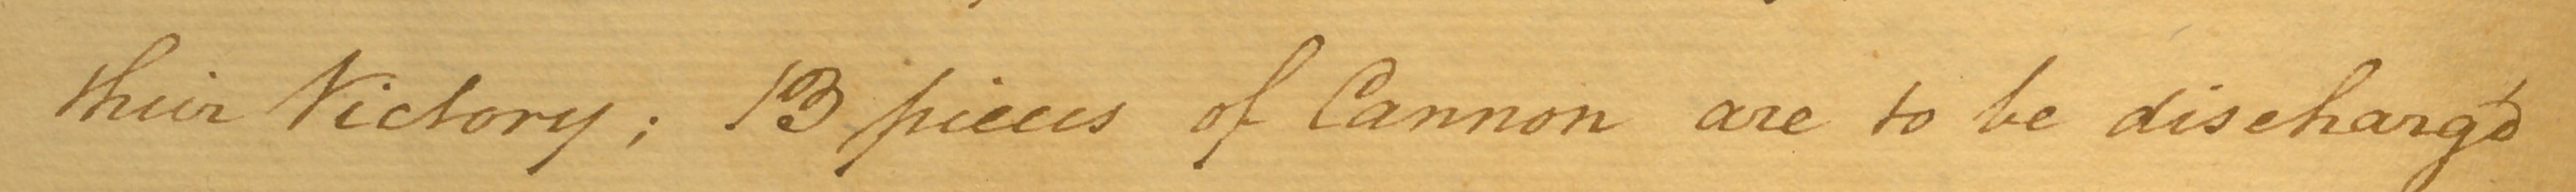their Victory; 13 pieces of Cannon are to be discharg'd
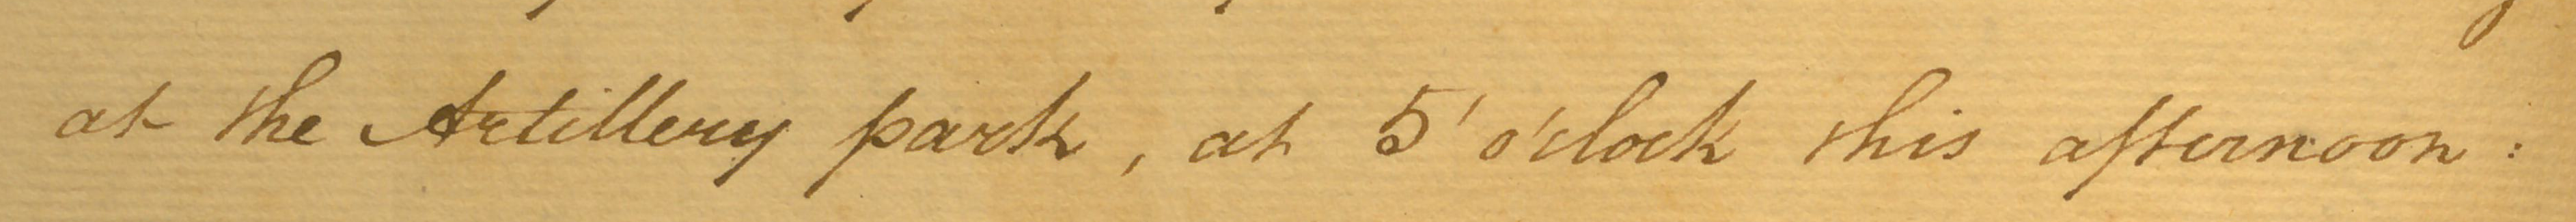at the Artillery park, at 5 o'clock this afternoon:
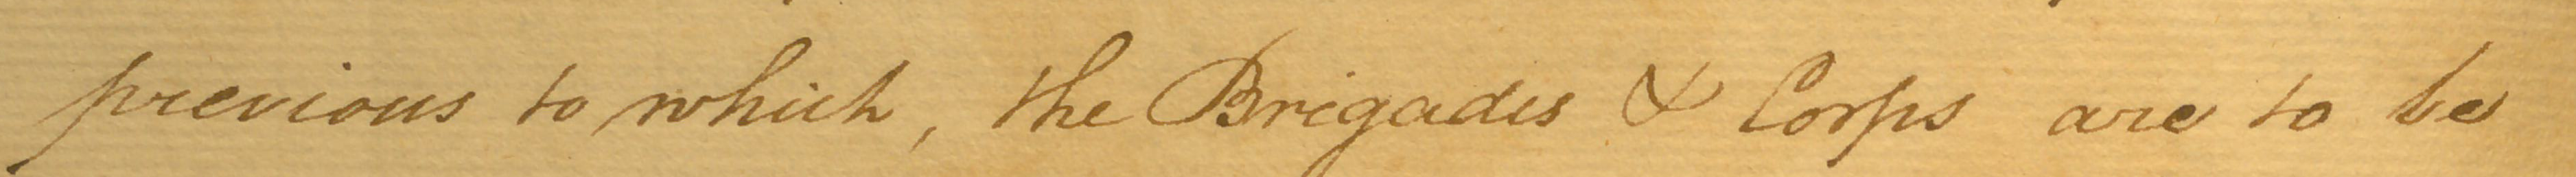previous to which, the Brigades & Corps are to be
